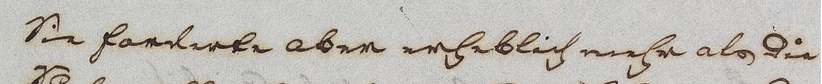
Sie forderte aber erheblich mehr als die
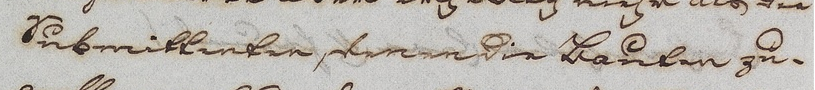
Submittenten, denen die Bauten zu-
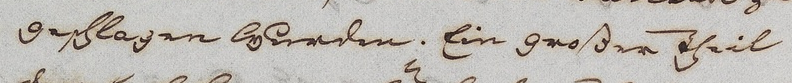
geschlagen wurden. Ein grosser Theil
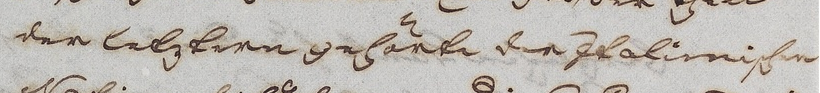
der letztern gehörte der Italienischen
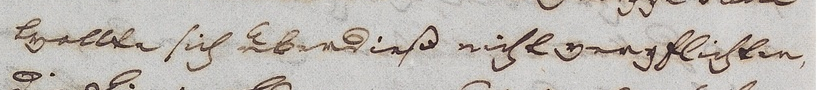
wollte sich überdieß nicht verpflichten,
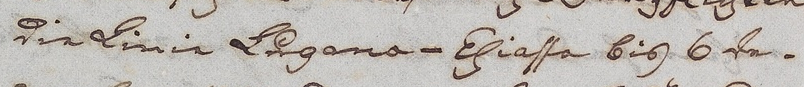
die Linie Lugano–Chiasso bis 6 De-
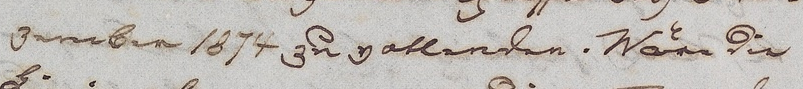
zember 1874 zu vollenden. Wäre die
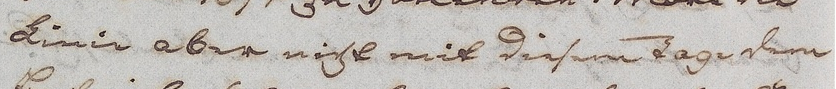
Linie aber nicht mit diesem Tage dem
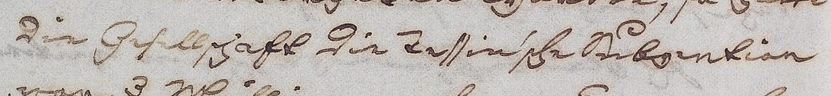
die Gesellschaft die Tessin'sche Subvention
